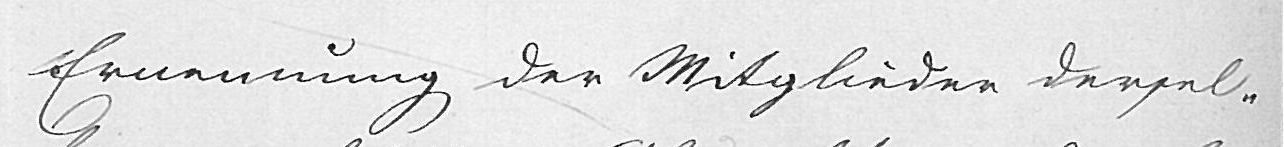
Ernennung der Mitglieder dersel-
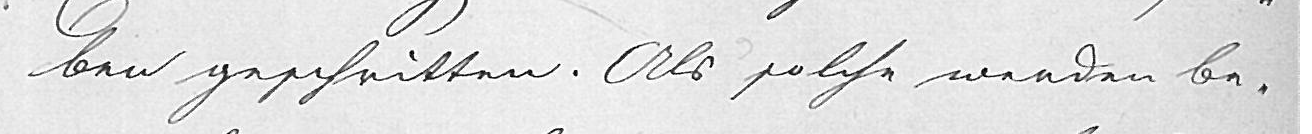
ben geschritten. Als solche werden be-
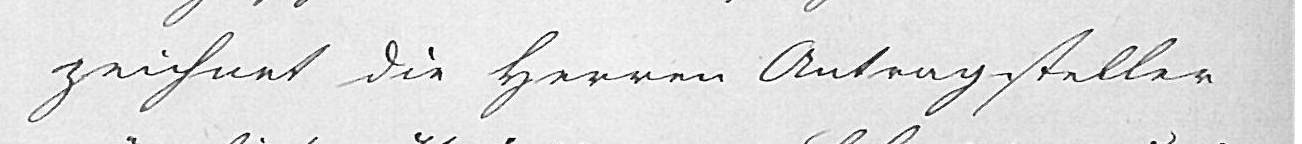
zeichnet die Herren Antragsteller
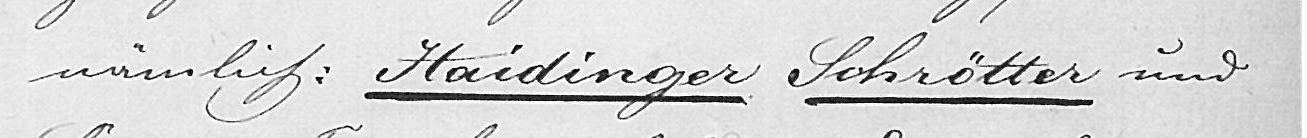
nämlich: Haidinger, Schrötter und
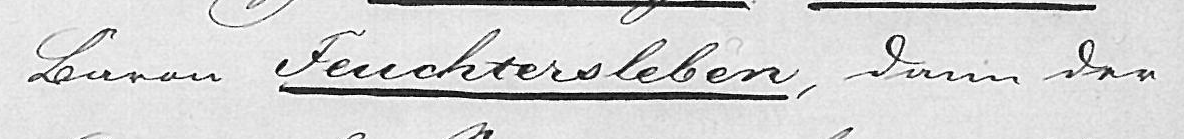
Baron Feuchtersleben, dann der
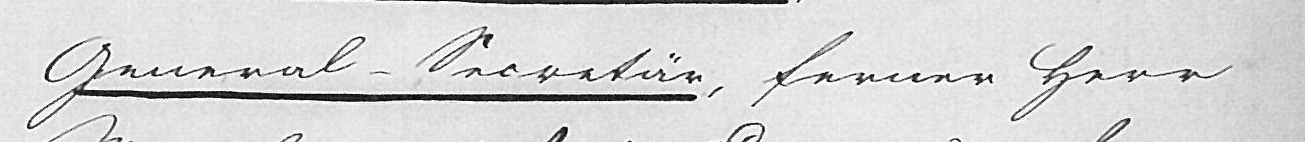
General-Secretär, ferner Herr
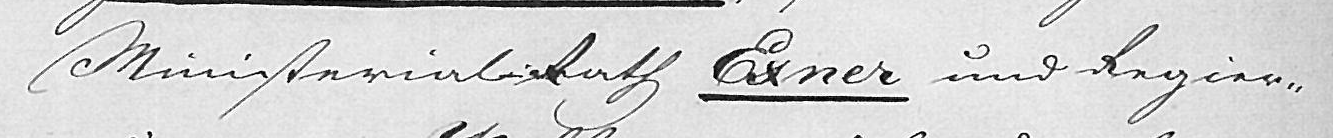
Minsterialrath Exner und Regier-
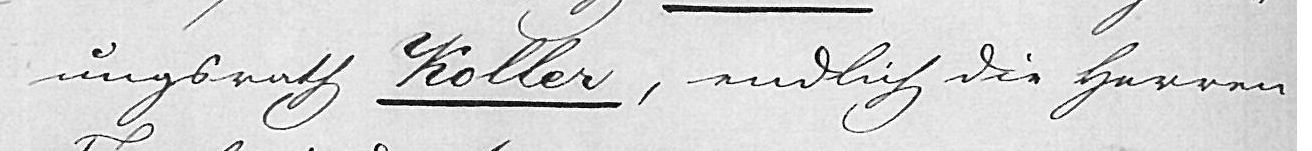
ungsrath Koller, endlich die Herren
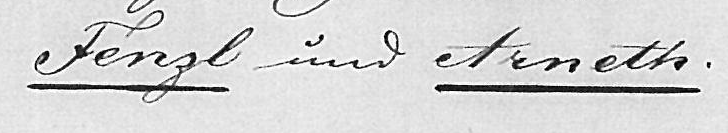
Fenzl und Arneth.
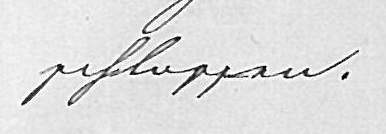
schlossen.
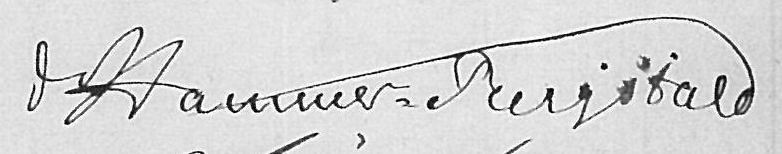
v. Hammer-Purgstall
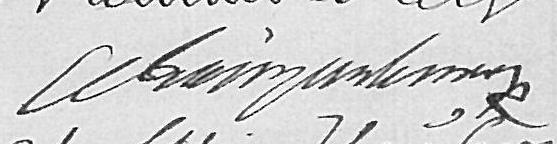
ABaumgartner
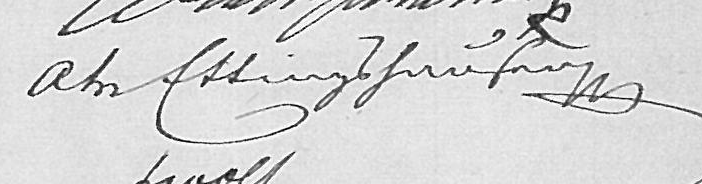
AvEttingshausen
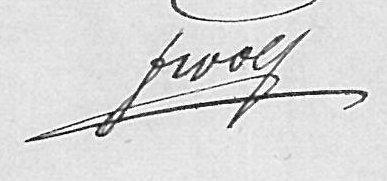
FWolf
